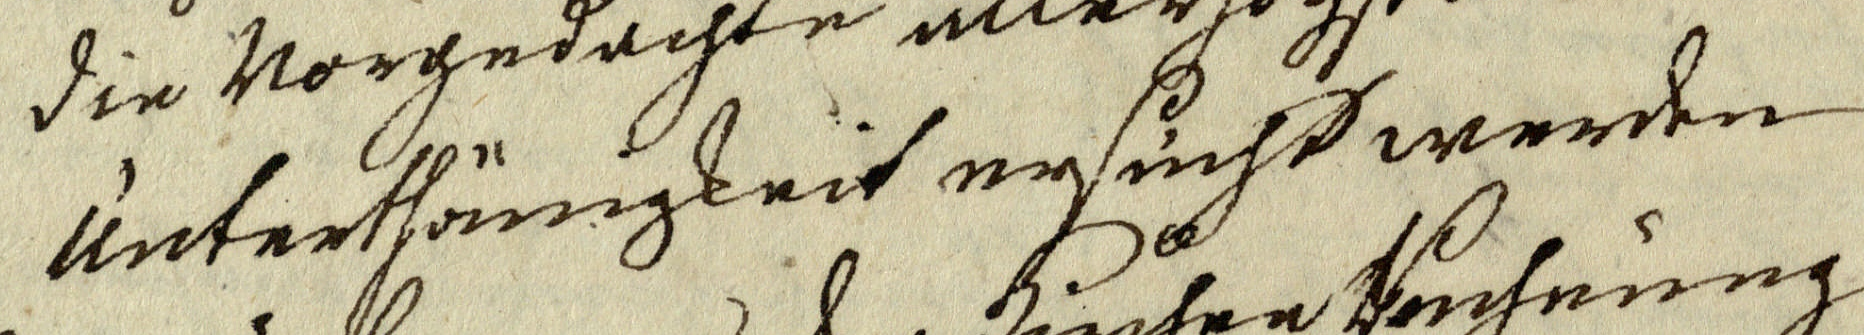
Unterthänigkeit ersucht werden.
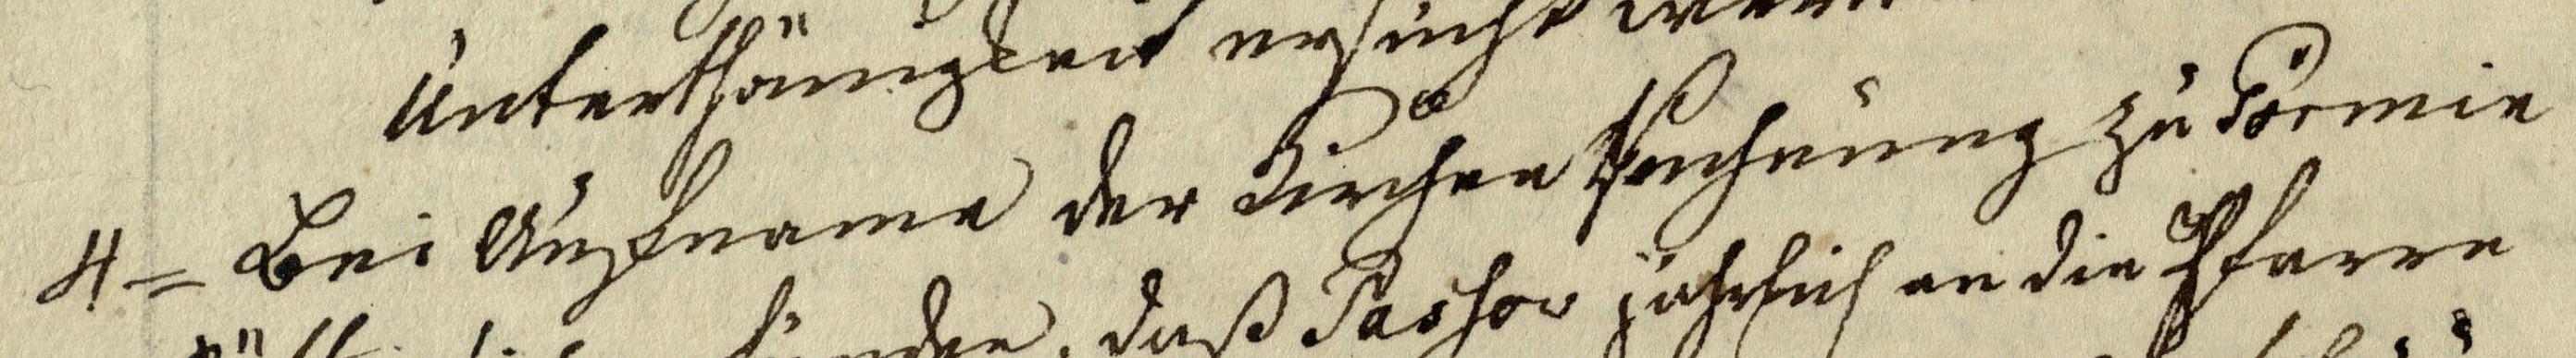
4. Bei Aufnahme der Kirchen Rechnung zu Görmin
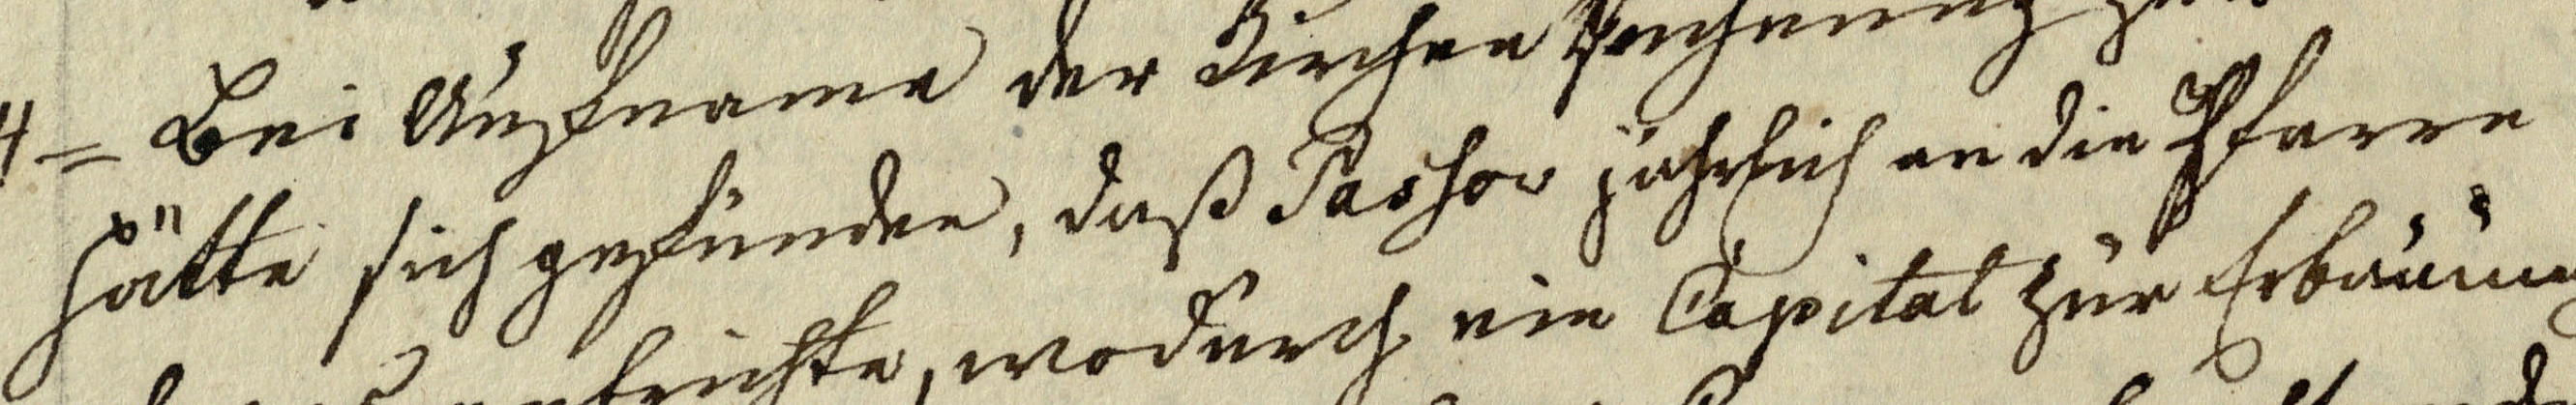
hätte sich gefunden, daß Passow jährlich an die Pfarre
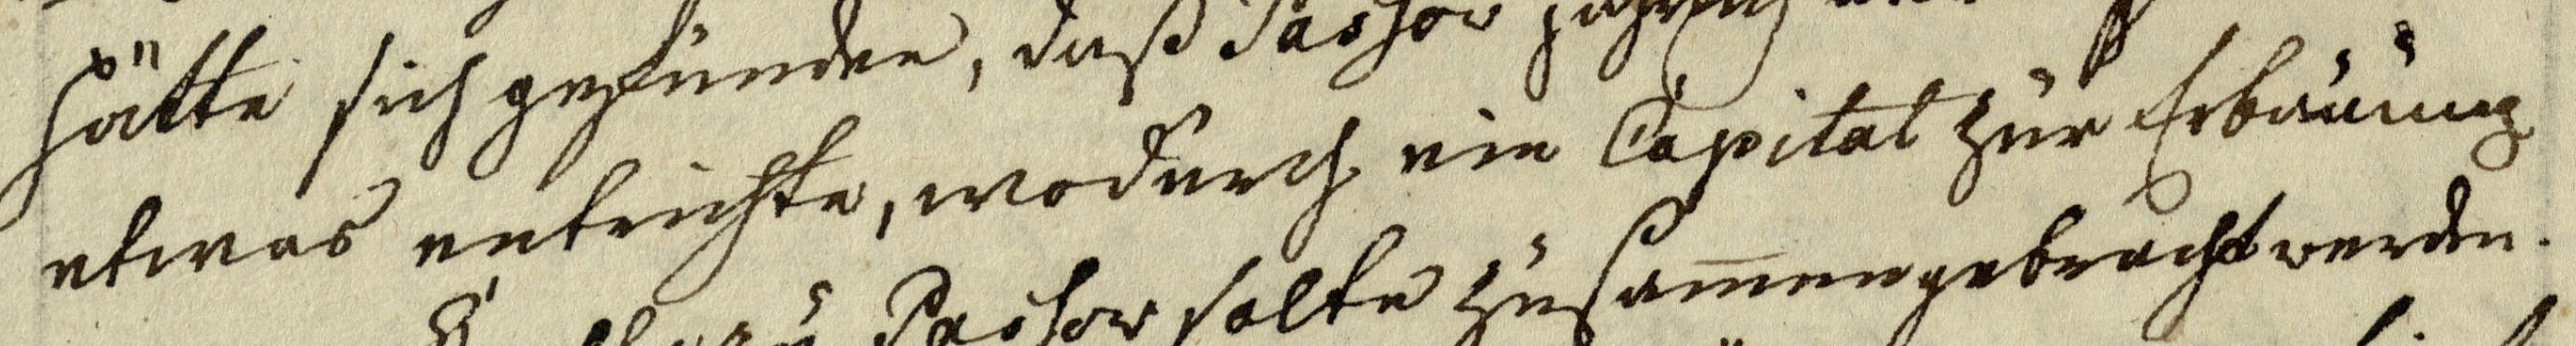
etwas entrichte, wodurch ein Capital zur Erbauung
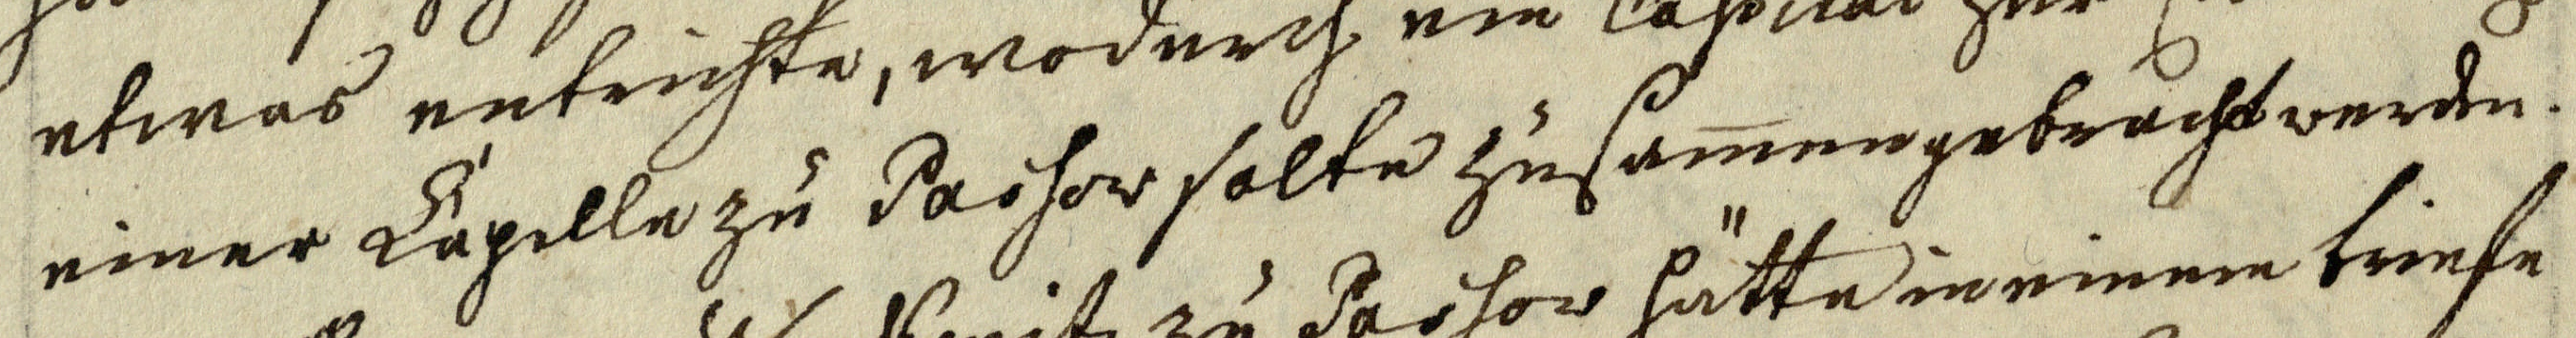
einer Capelle zu Passow solte zusammen gebracht werden.
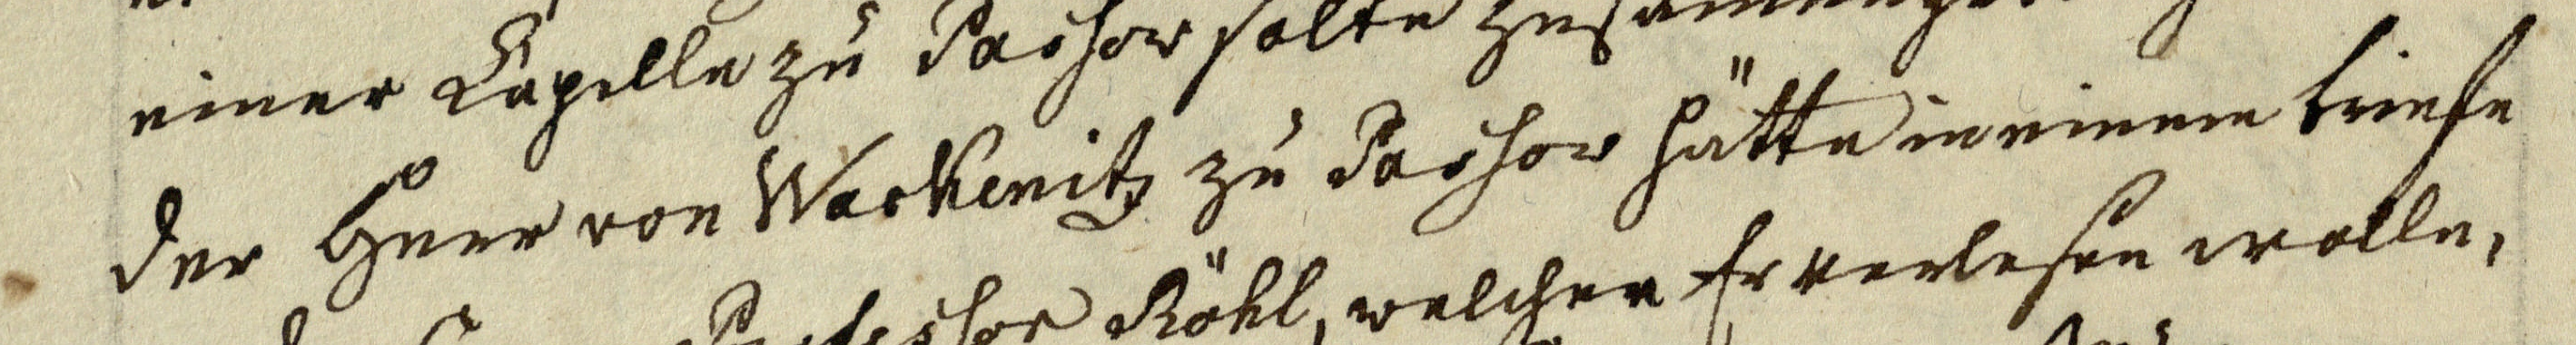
Der Herr von Wackenitz zu Passow hätte in einem Briefe
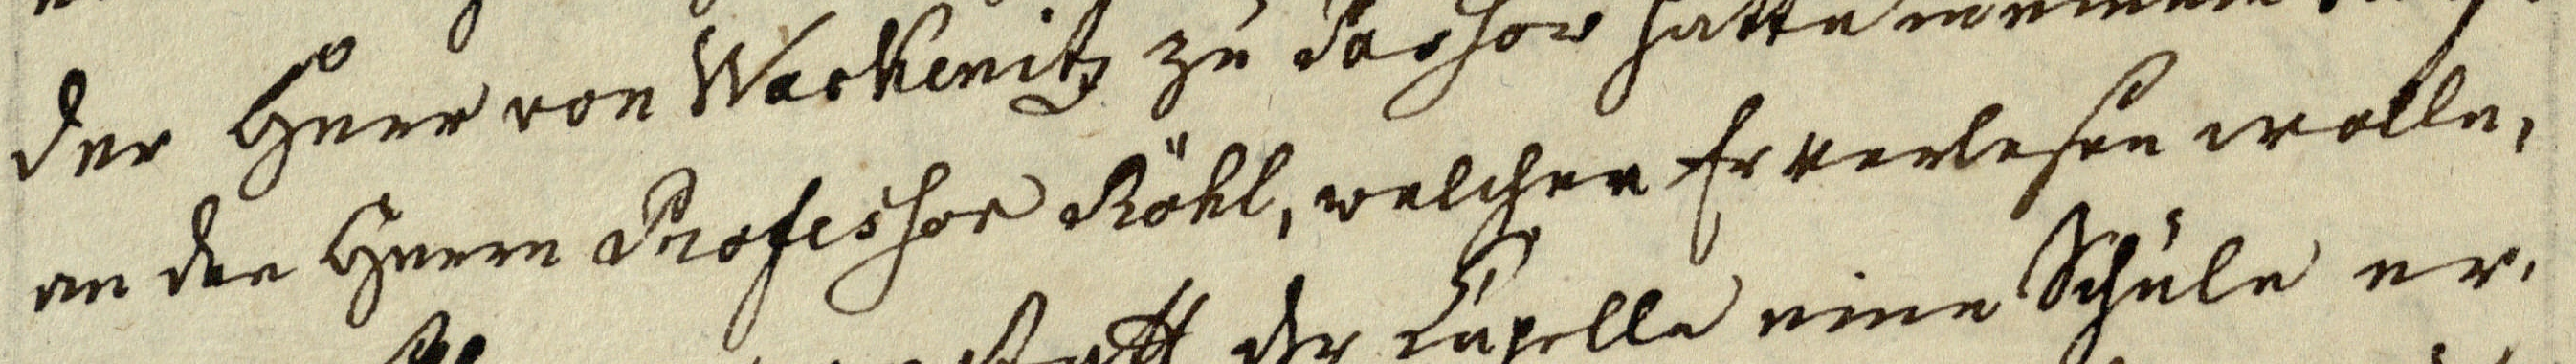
an den Herrn Professor Röhl, welchen Er verlesen wolle,
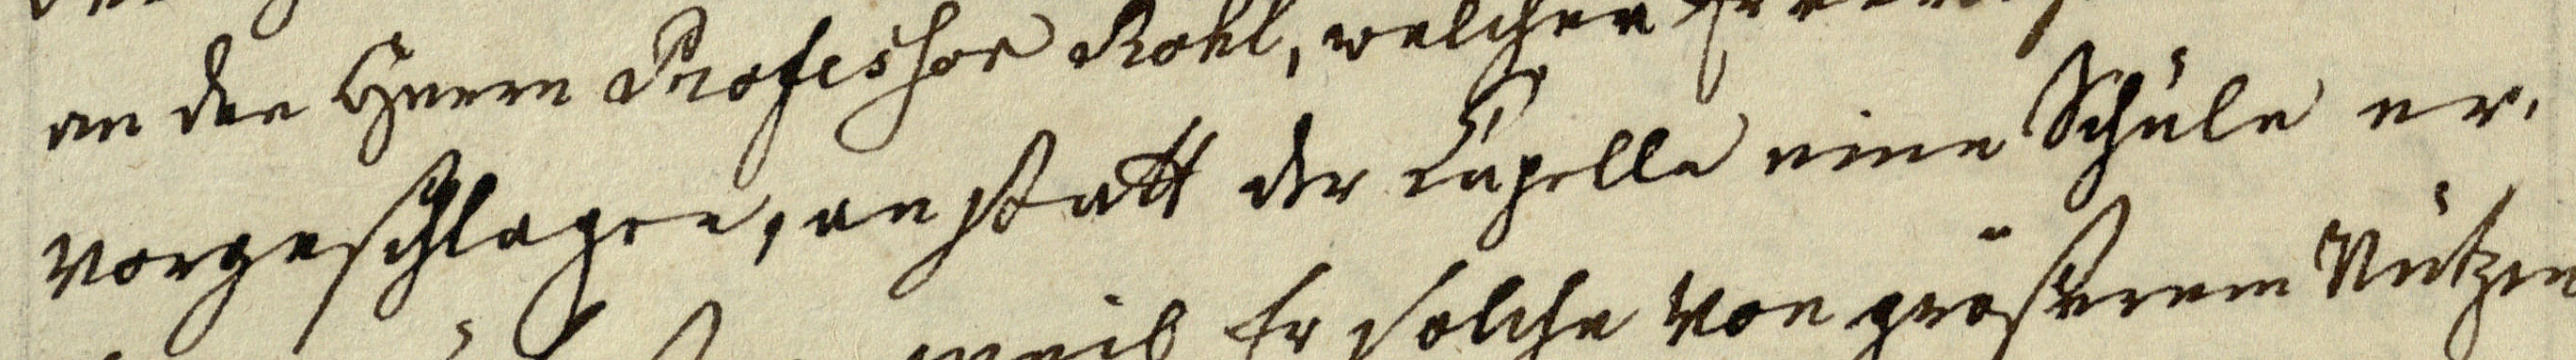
vorgeschlagen, anstatt der Capelle eine Schule er¬
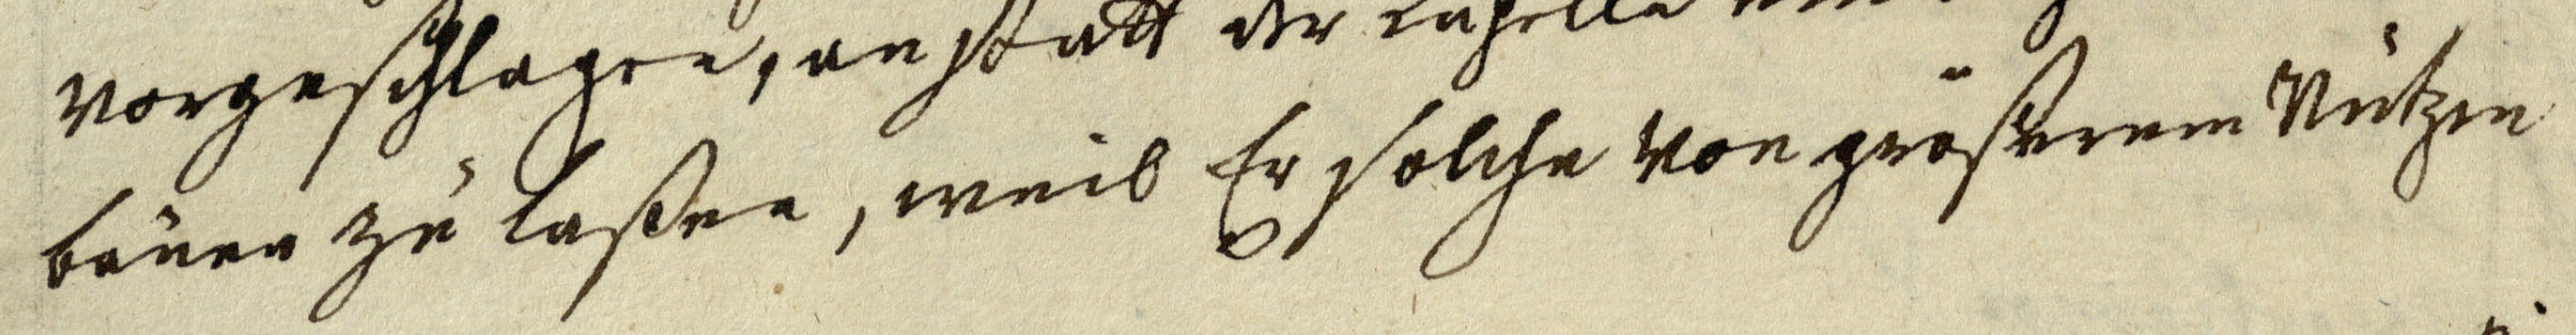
bauen zu laßen, weil Er solche von größerem Nutzen
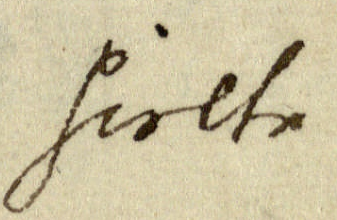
hielte
